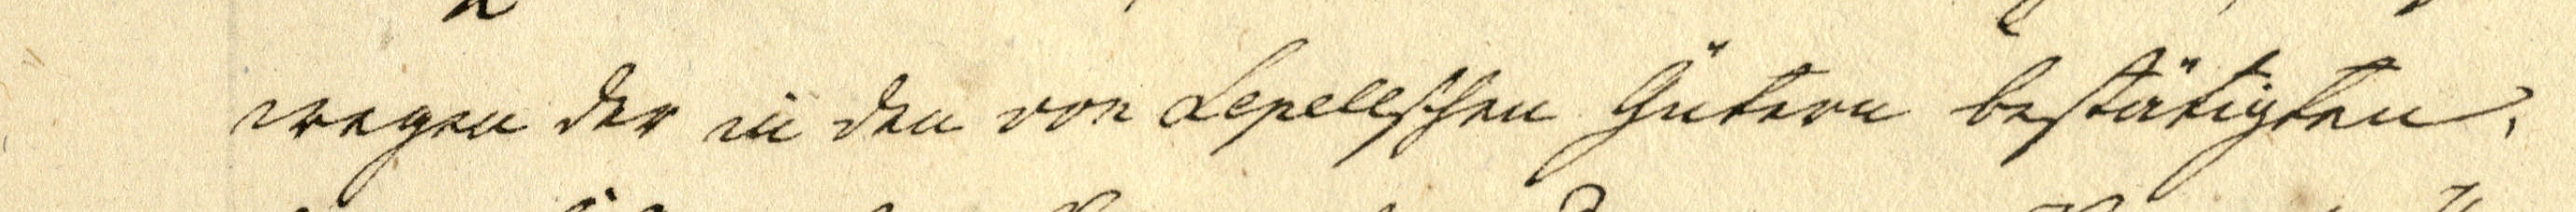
wegen der in den von Lepellschen Gütern bestätigten
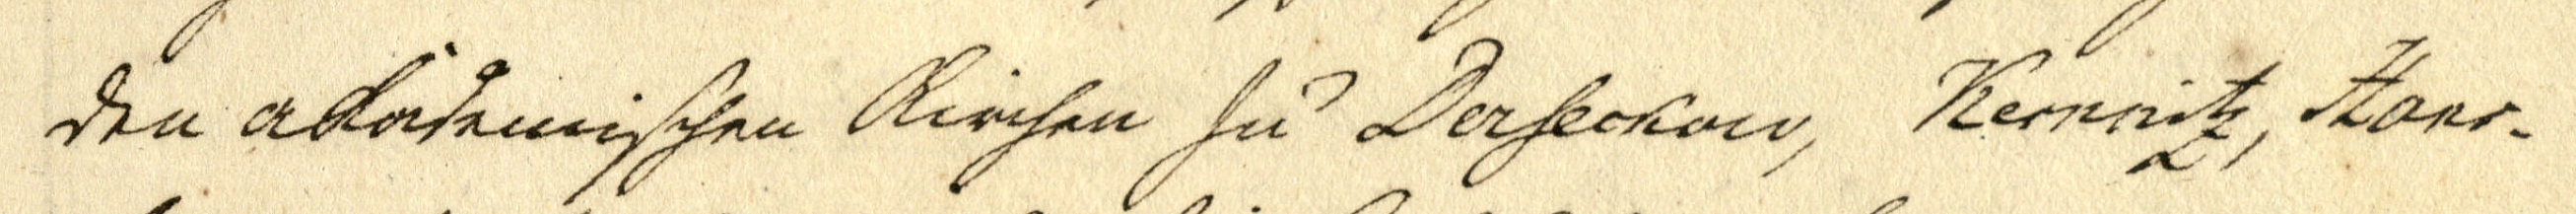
den akademischen Kirchen zu Dersekow, Kemnitz, Hans¬
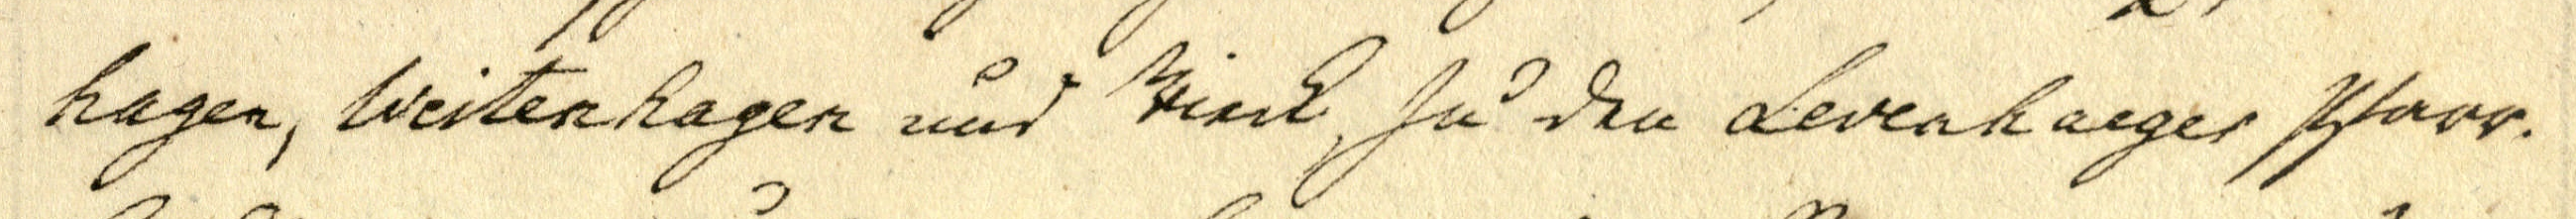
hagen, Weitenhagen und Wieck zu den Levenhaeger Pfarr¬
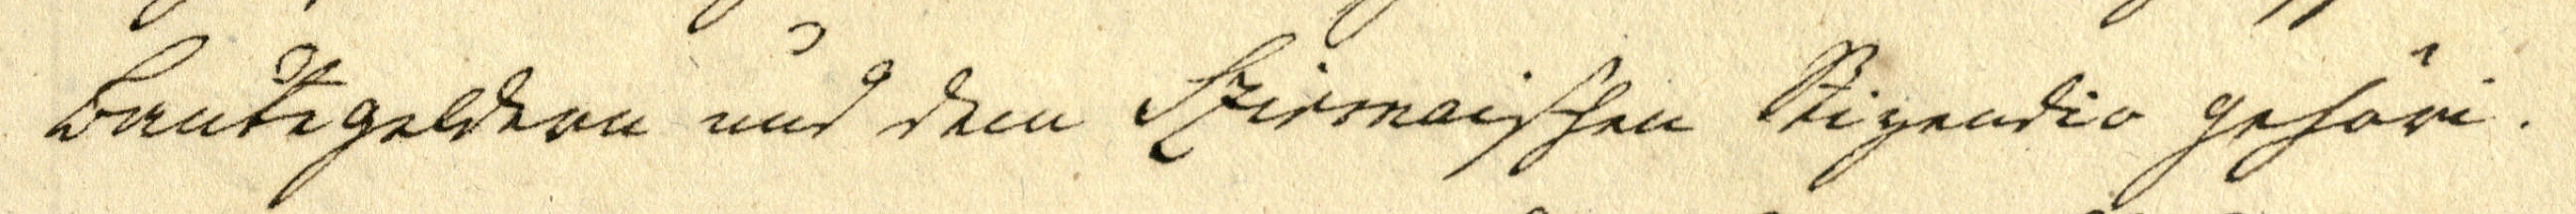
Bautegeldern und dem Szirmaischen Stipendio gehöri¬
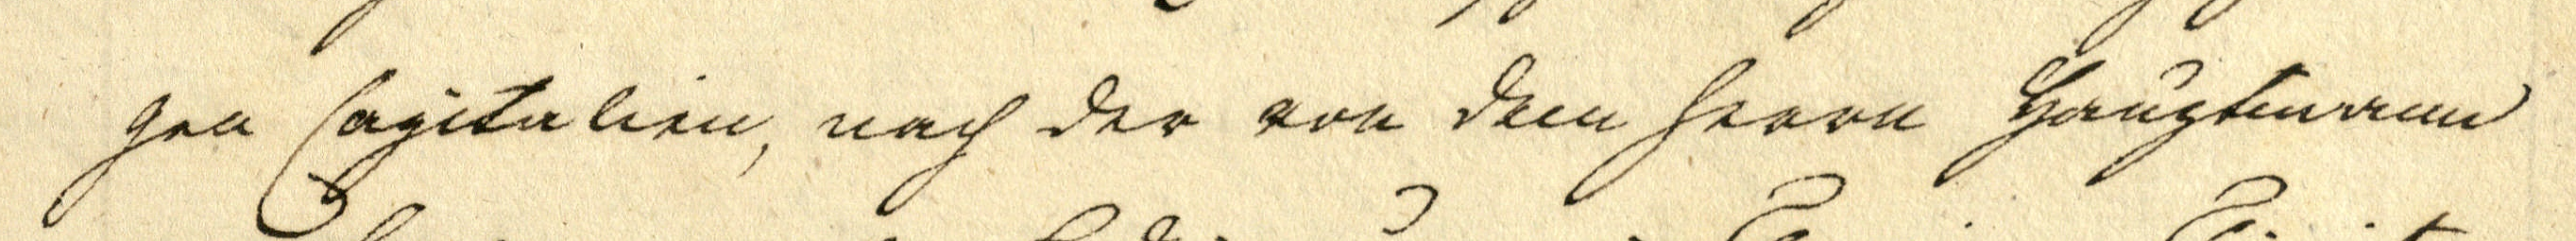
gen Capitalien, nach der von dem herrn Hauptmann
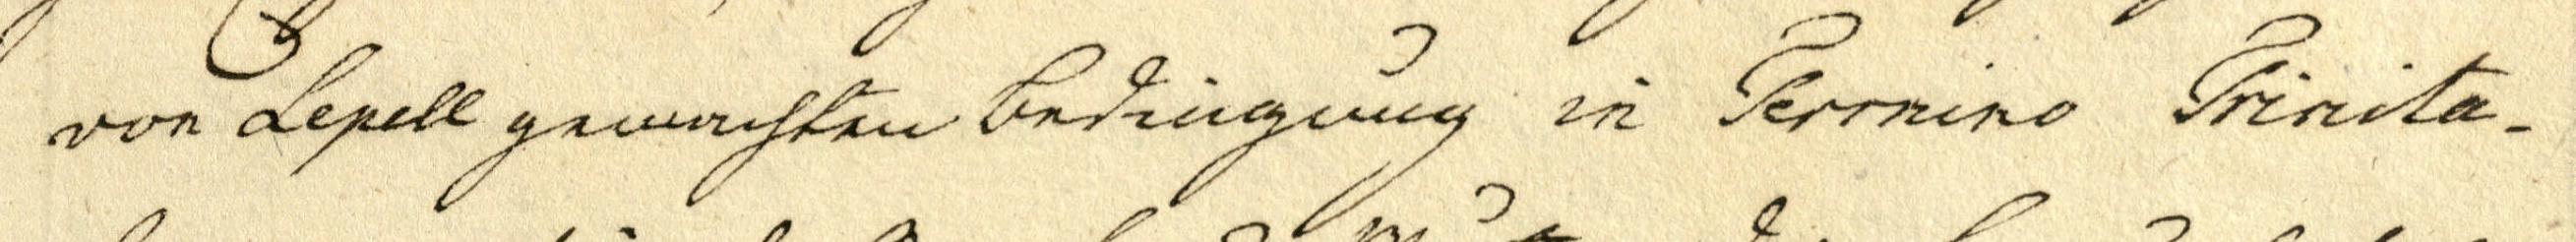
von Lepell gemachten Bedingung in Termino Trinita¬
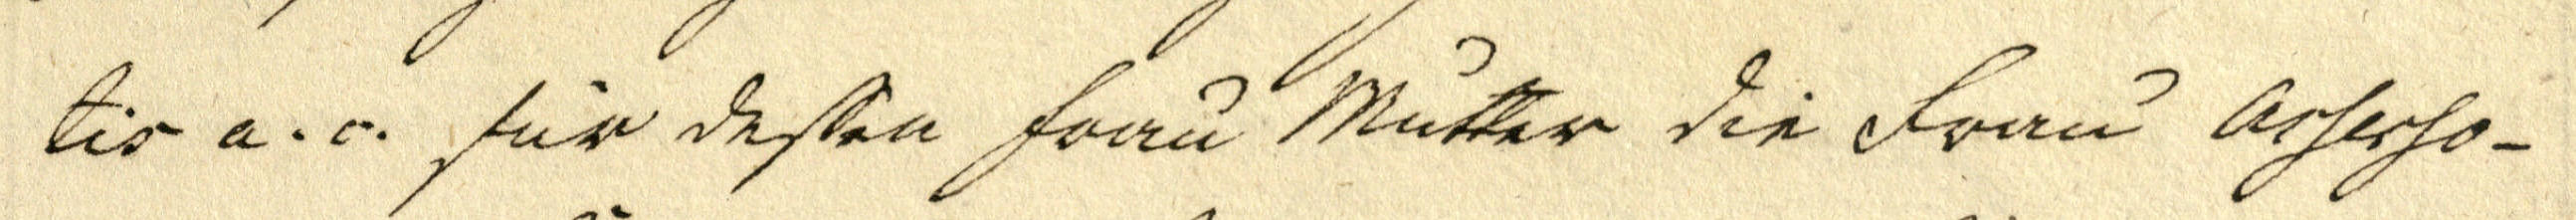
tis a. c. für dessen Frau Mutter die Frau Assesso¬
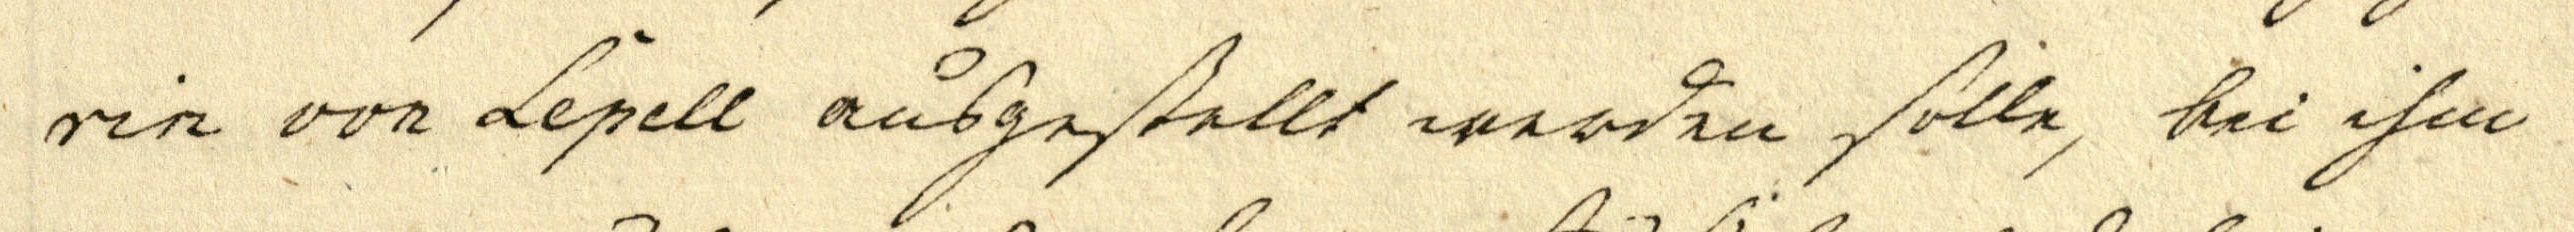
rin von Lepell ausgestellt werden solle, bei ihm
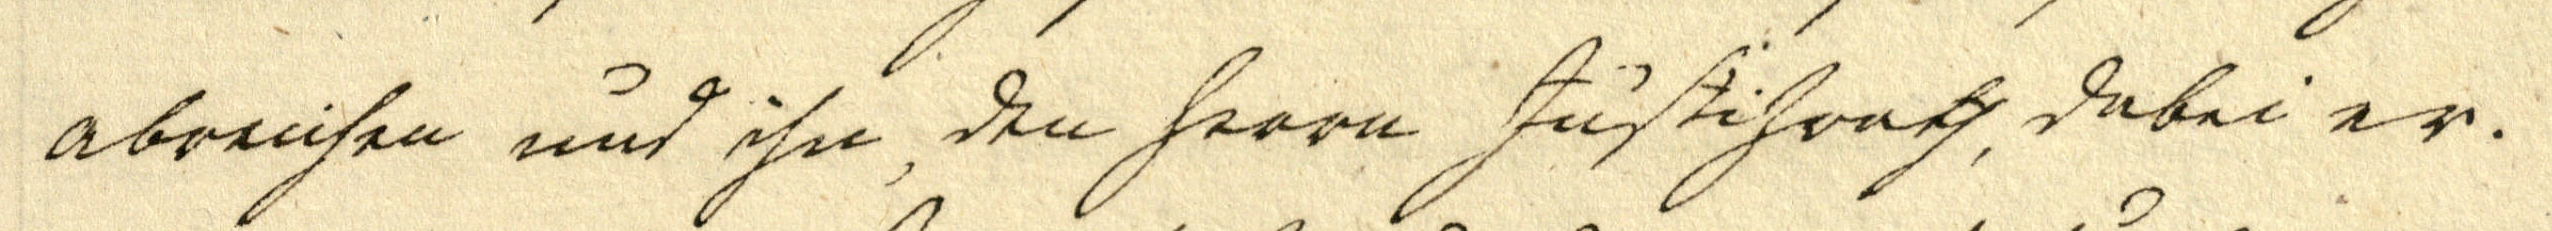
abreichen und ihn den herrn Justizrath, dabei er¬
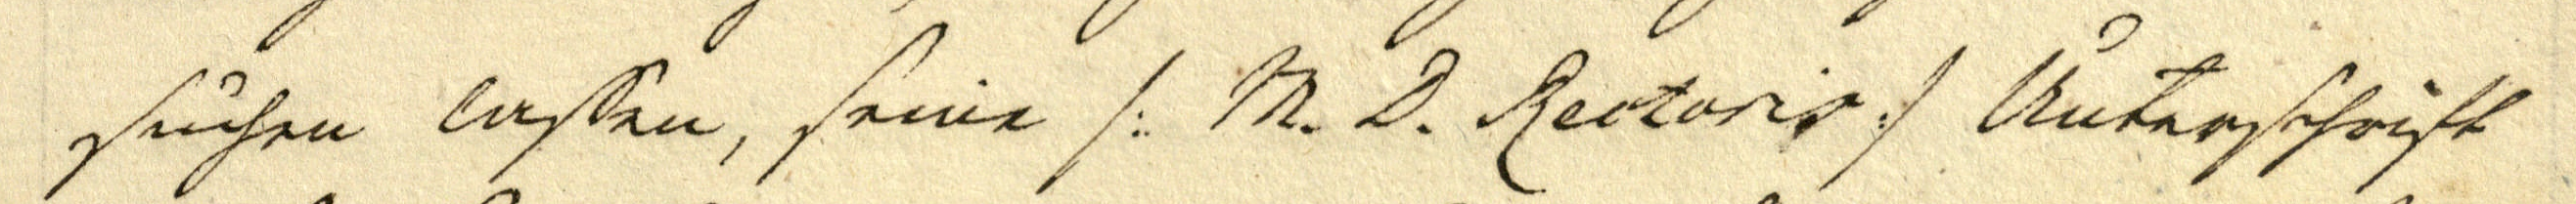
suchen lassen, seine / M. D. Rectoris / Unterschrift
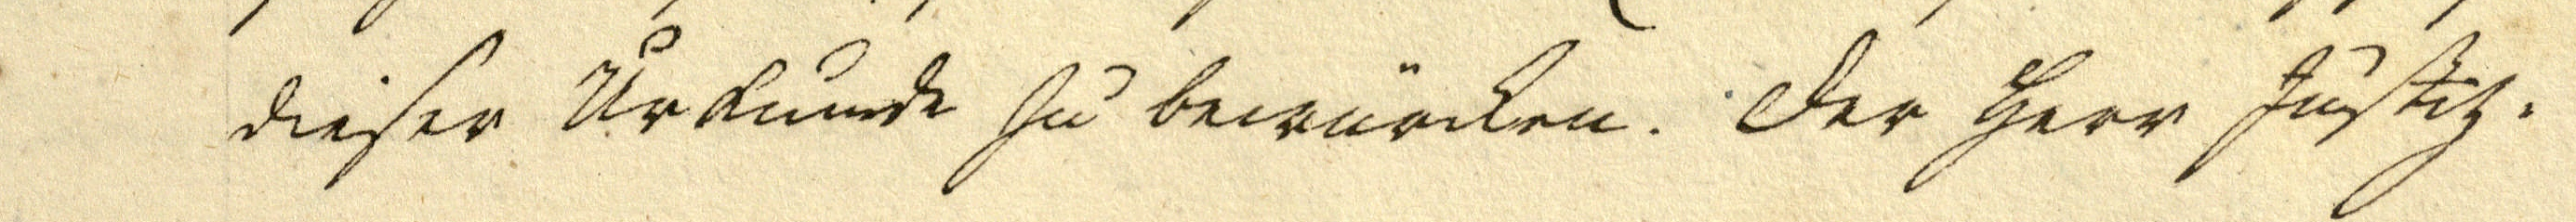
dieser Urkunde zu bewürcken. Der Herr Justiz-
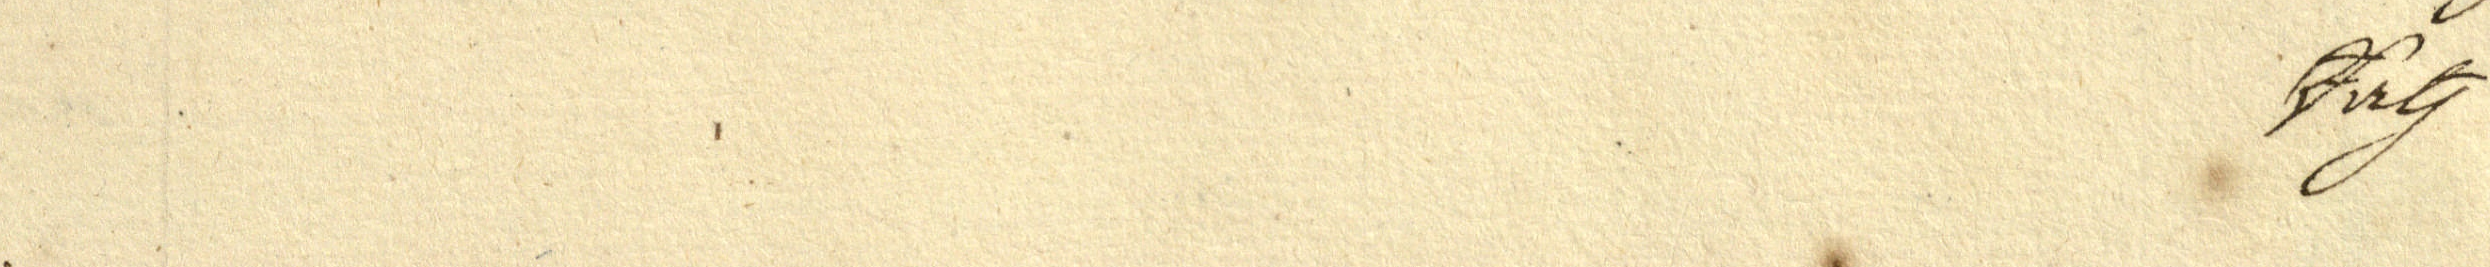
Rath
